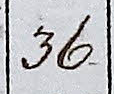36
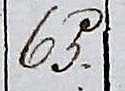65.
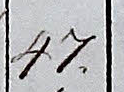47.
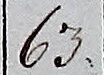63
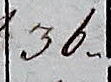36
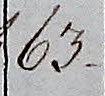63
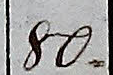80
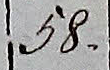58
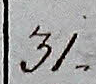31
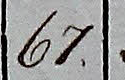67.
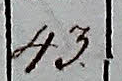43.
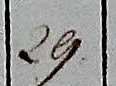29.
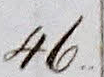46
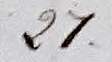27
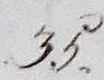35
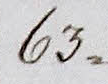63
